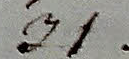31
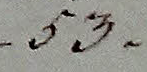53
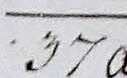37
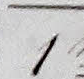1
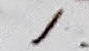1
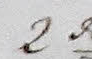2
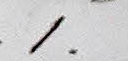1.
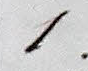1
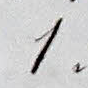1
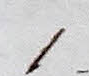1
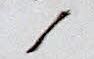1
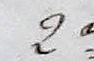2
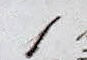1
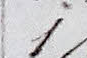1
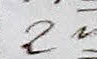2
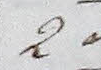2
